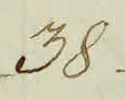38
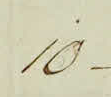10
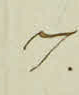7
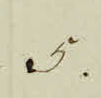5
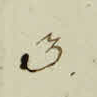3
